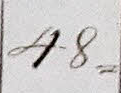48
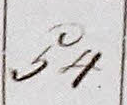54
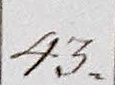43
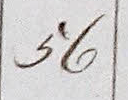56
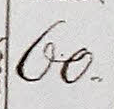60
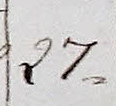27
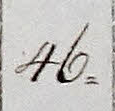46
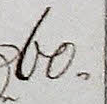60
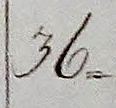36
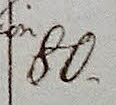80
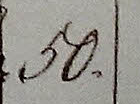50.
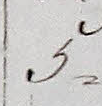5
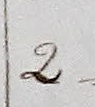2
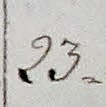23
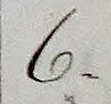6
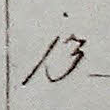13
